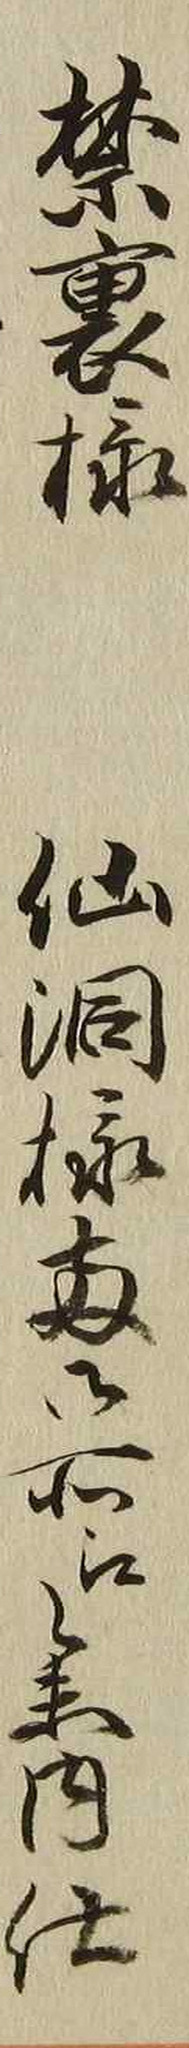禁裏様仙洞様両御所江参内仕
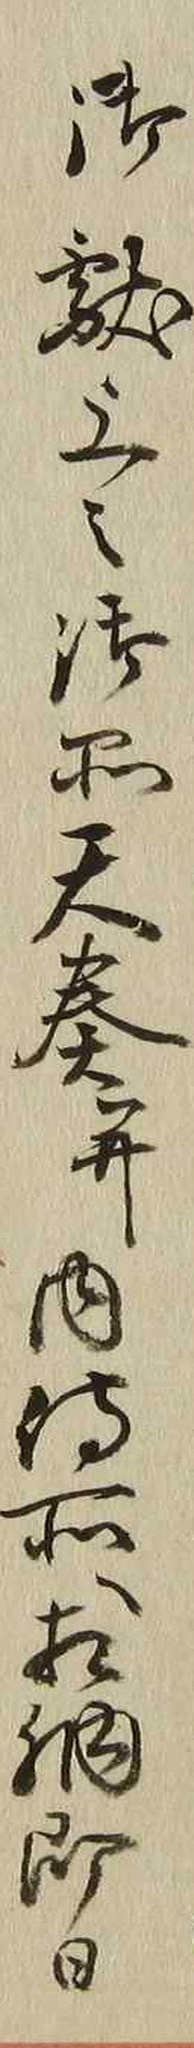御献上之御品天奏幷内侍所へ相納即日
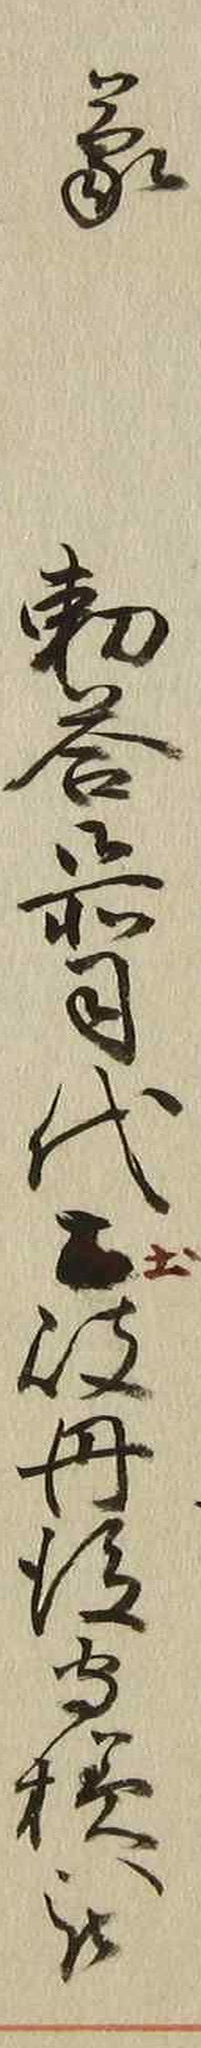蒙勅答御所司代土岐丹後守様へ被
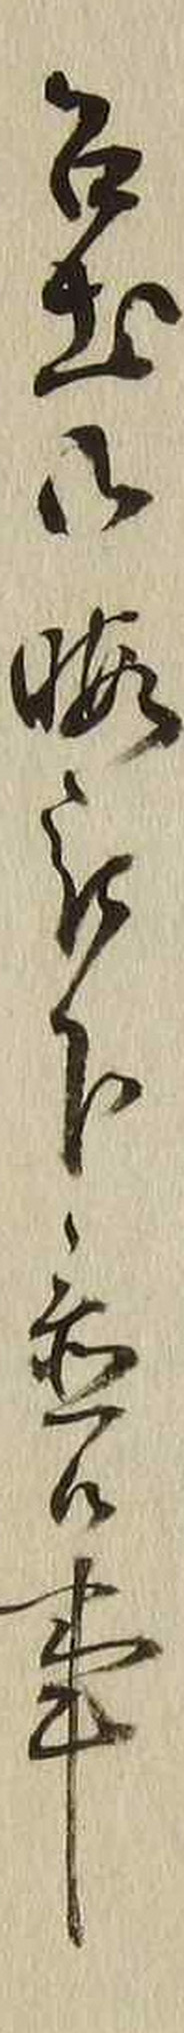召出御暇被下置候事
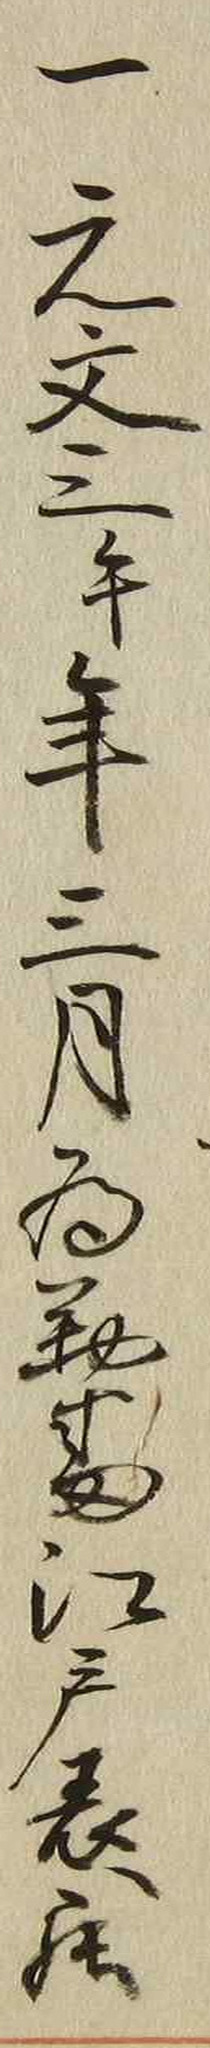一元文三午年三月為勤番江戸表へ罷
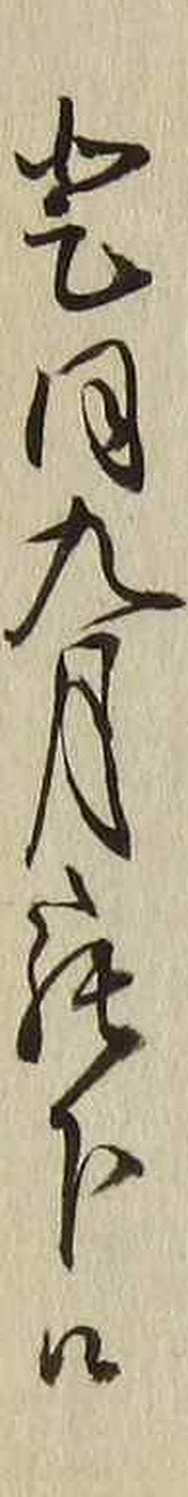登同九月罷下候
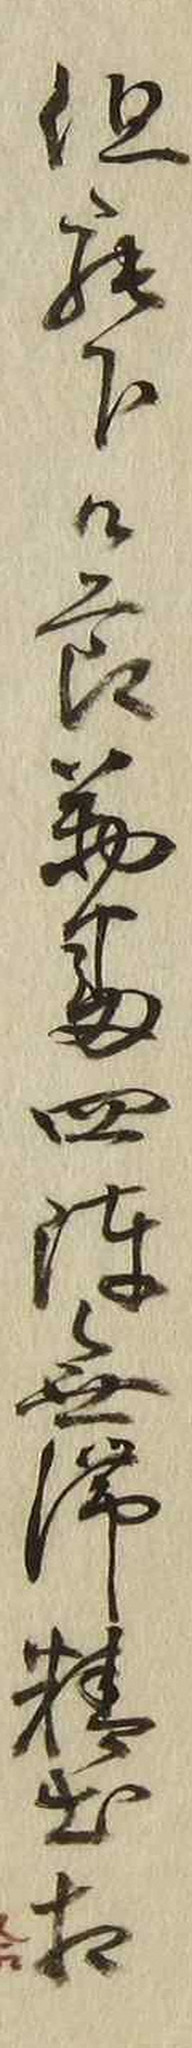但罷下候節勤番四陣無滞精出相
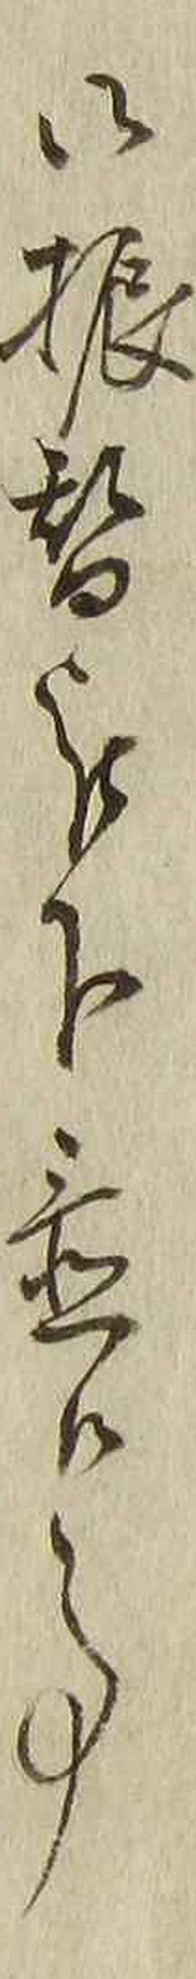御振替被下置候事
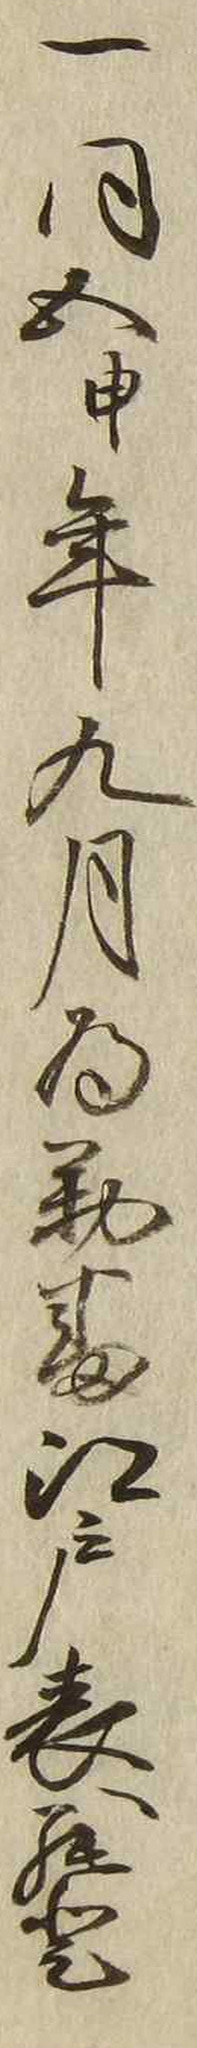一同五申年九月為勤番江戸表へ罷登

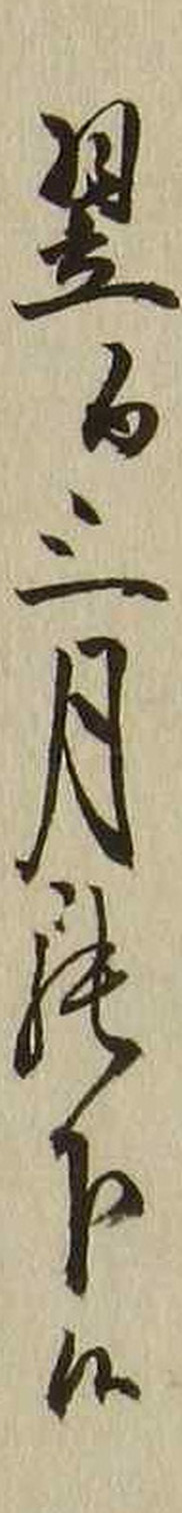翌酉三月罷下候
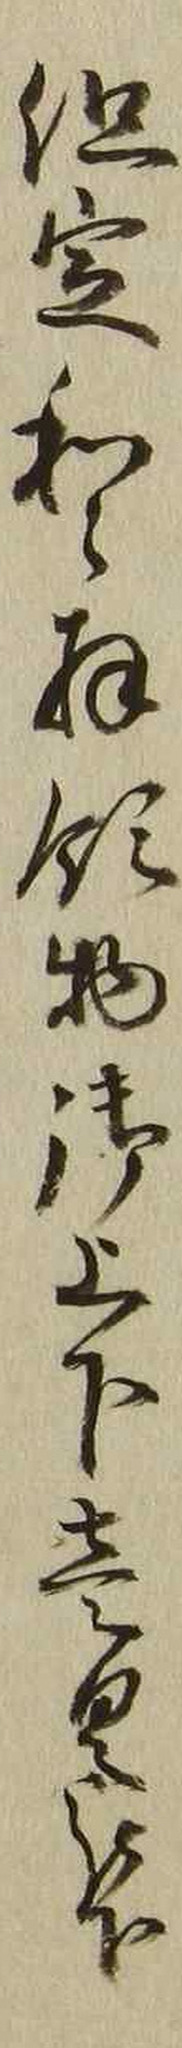但定和之拝領物御上下壱具被下
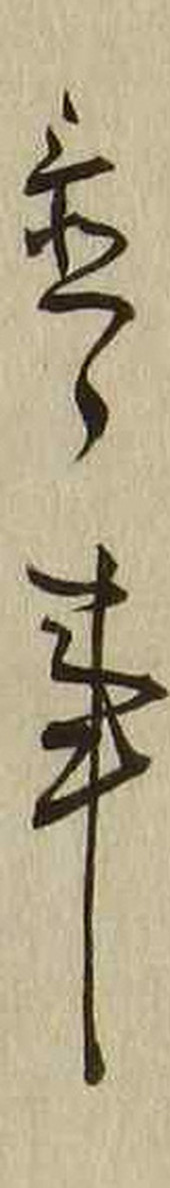置候事
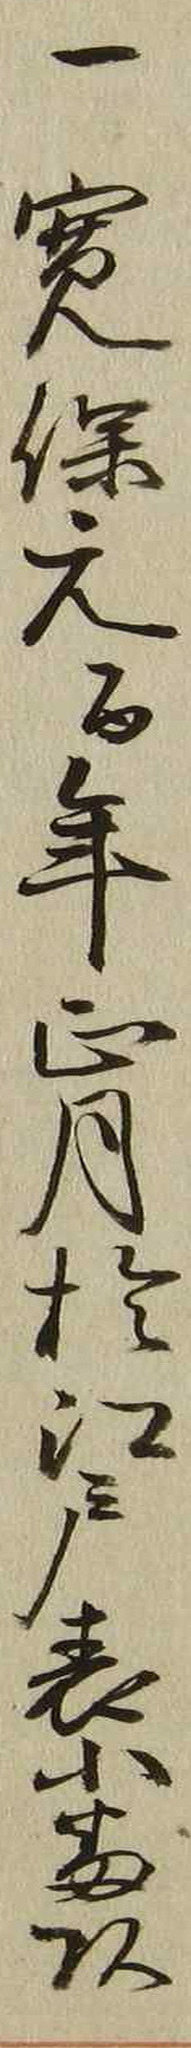一寛保元酉年正月於江戸表小番頭
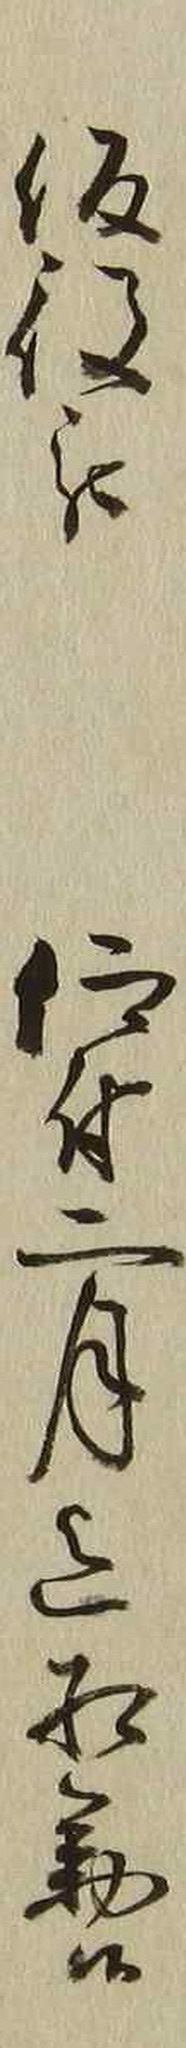仮役被仰付二月迄相勤候
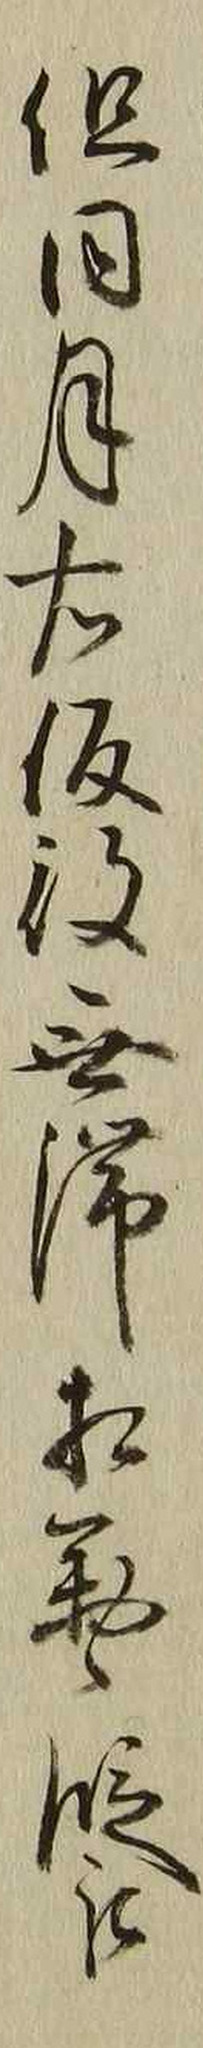但同月右仮役無滞相勤候段被
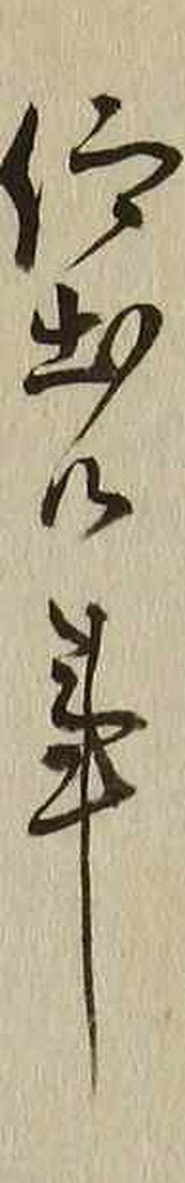仰出候事
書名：諸士系譜　巻之60　と之部3
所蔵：会津若松市立会津図書館
